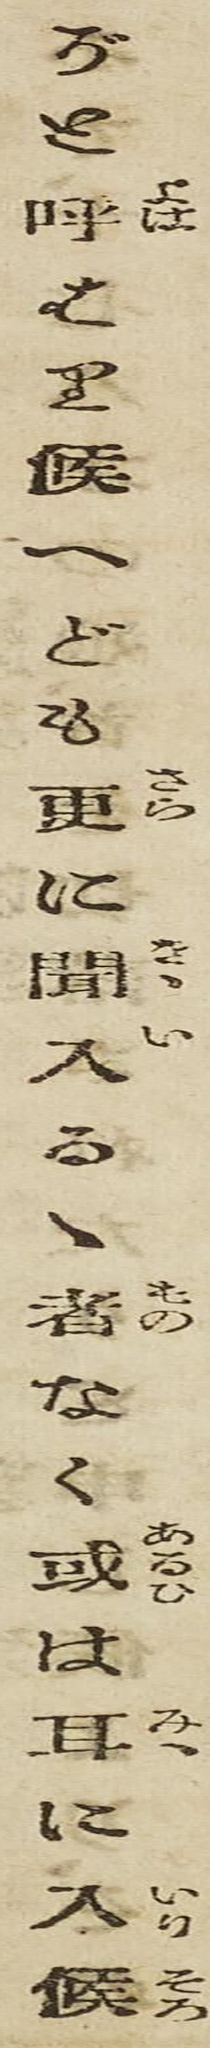ぞと呼はり候へども更に聞入るゝ者なく或は耳に入候
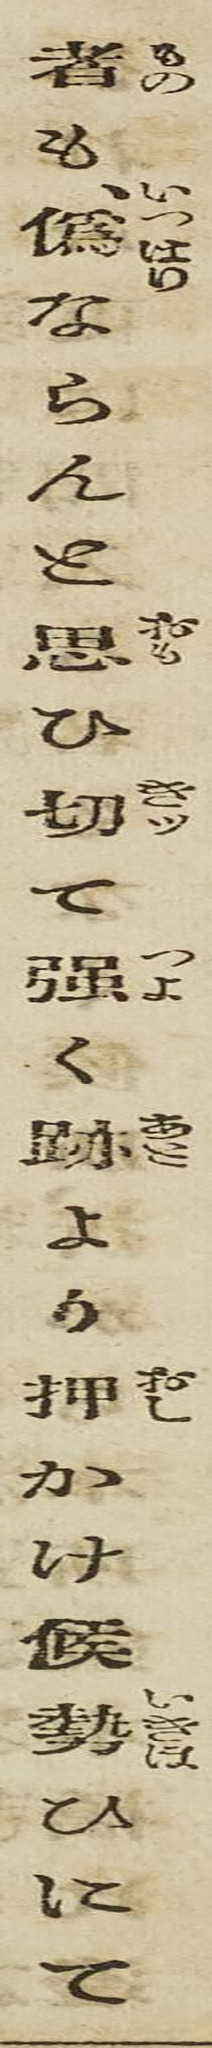者も、偽ならんと思ひ切て強く跡より押かけ候勢ひにて
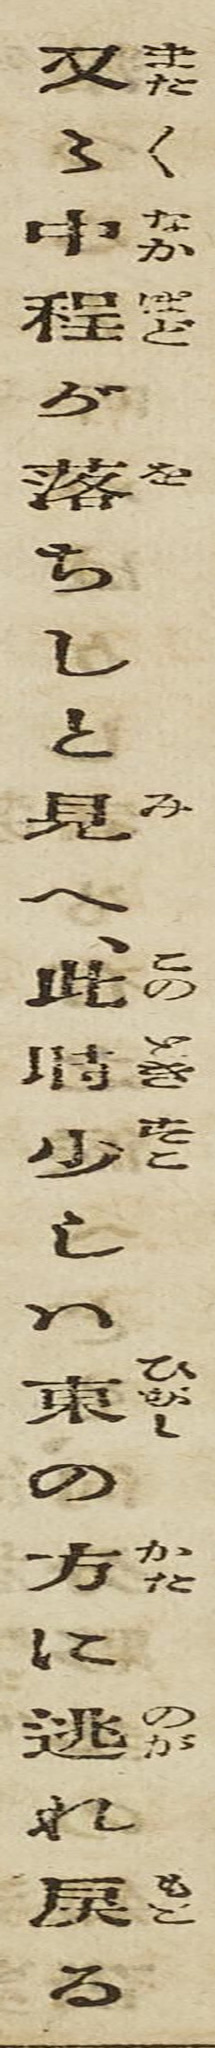又〻中程が落ちしと見へ、此時少しは東の方に逃れ戻る
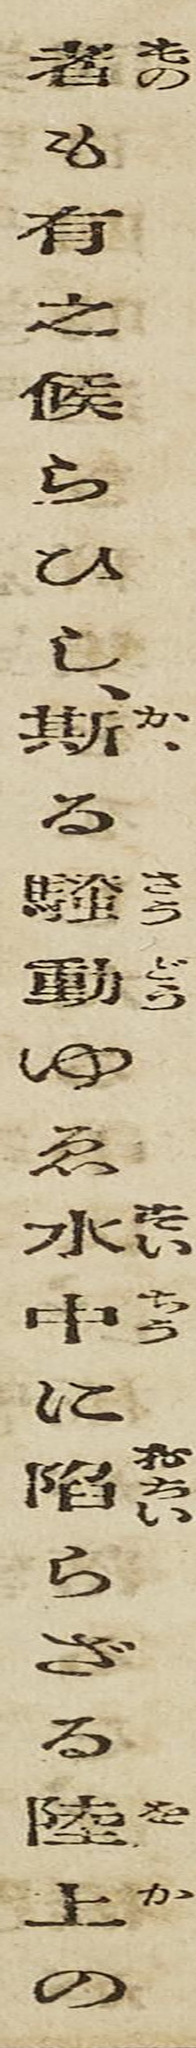者も有之候らひし、斯る騒動ゆゑ水中に陥らざる陸上の
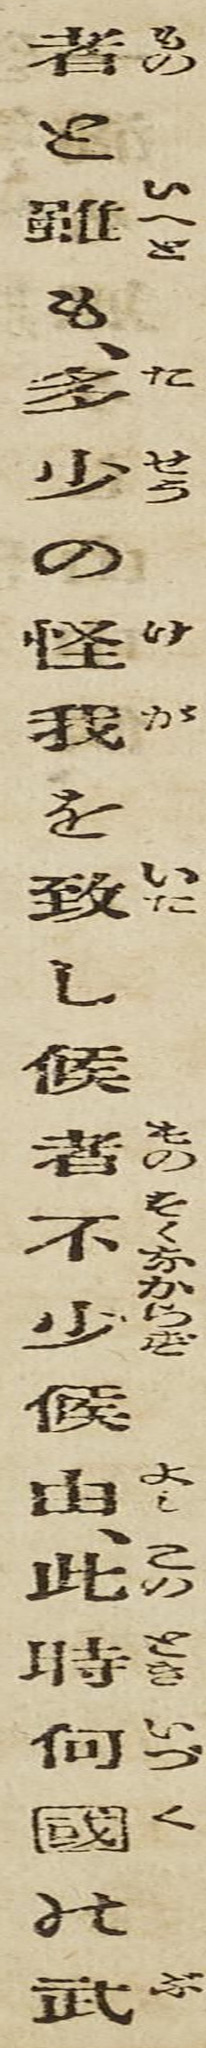者と雖も、多少の怪我を致し候者不少候由、此時何国の武
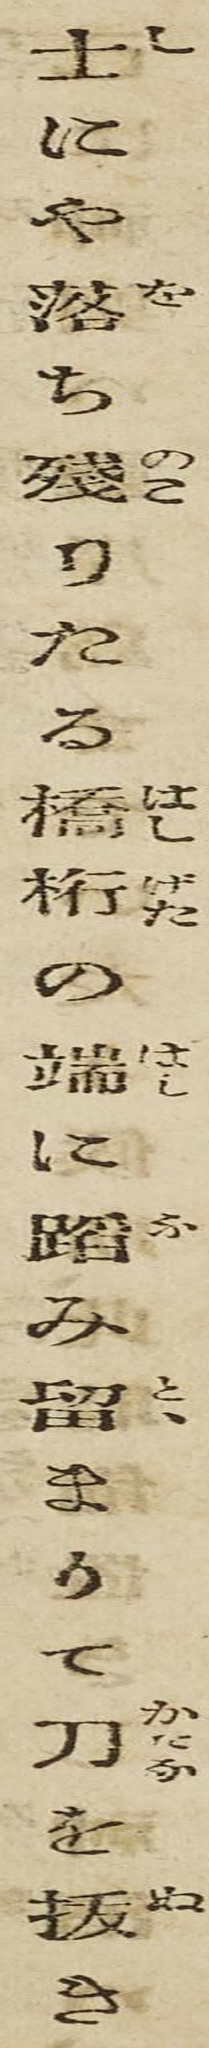士にや落ち残りたる橋桁の端に踏み留まりて刀を抜き
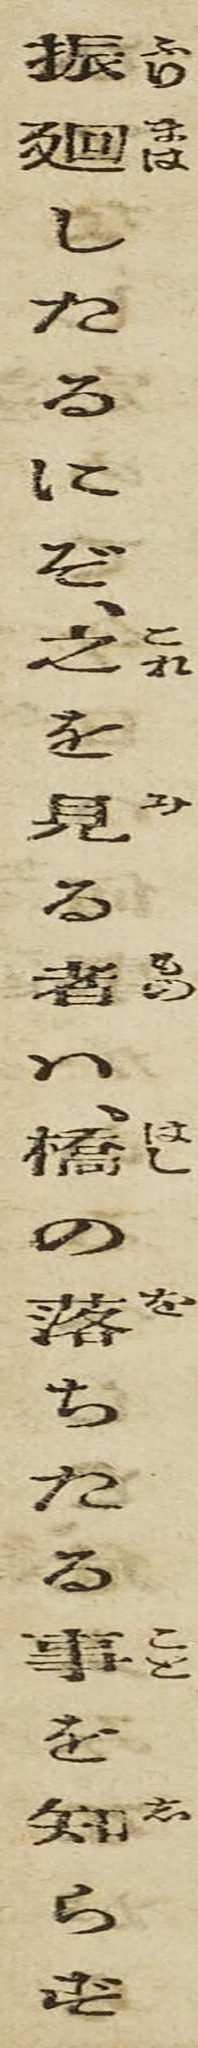振廻したるにぞ、之を見る者は、橋の落ちたる事を知らず
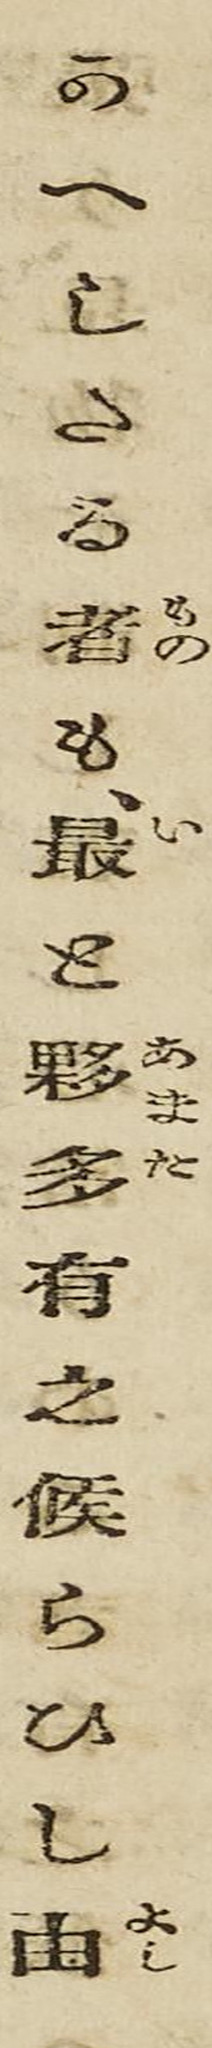かへしたる者も、最も夥多有之候らひし由
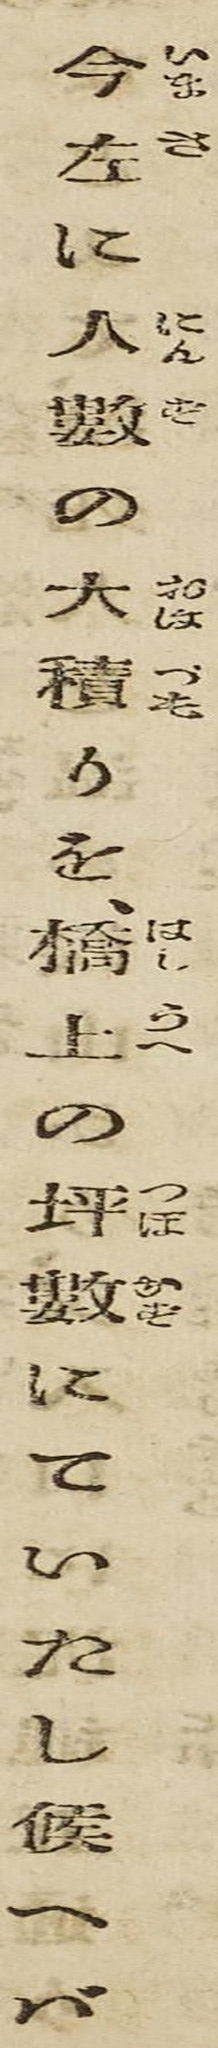今左に人数の大積りを、橋上の坪数にていたし候へば
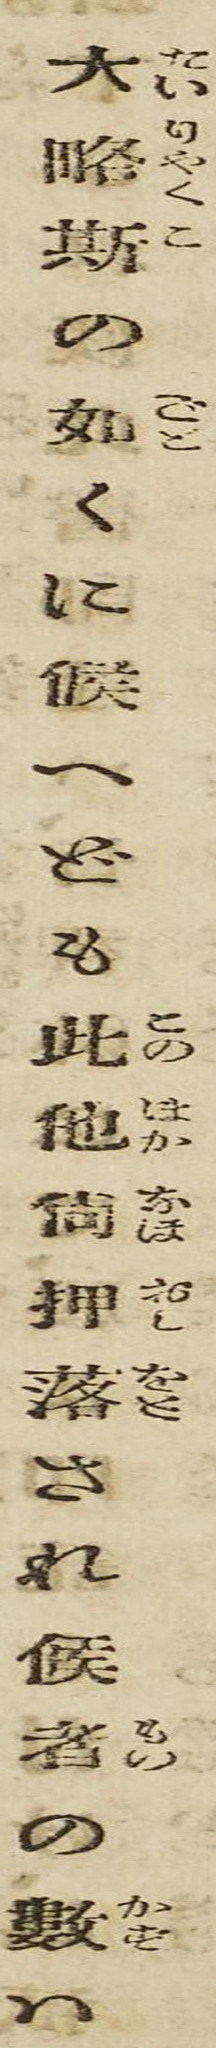大略斯の如くに候へども此他尚押落され候者の数は
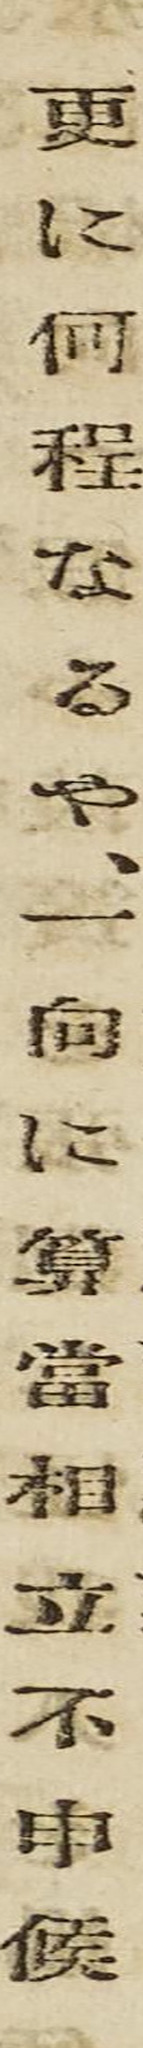更に何程なるや、一向に算当相立不申候
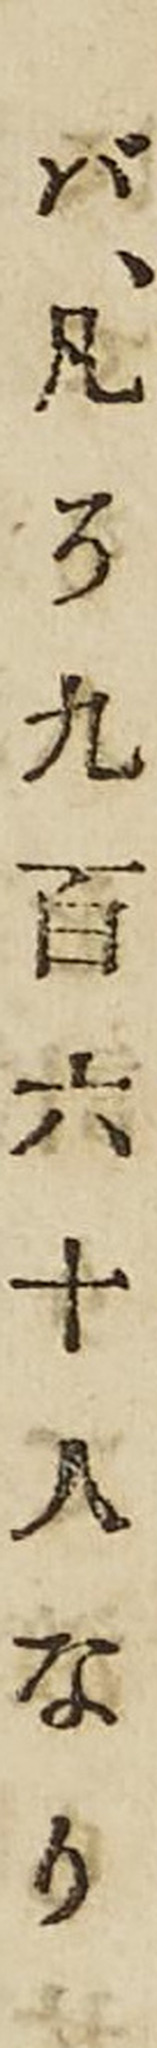ば、凡そ九百六十人なり
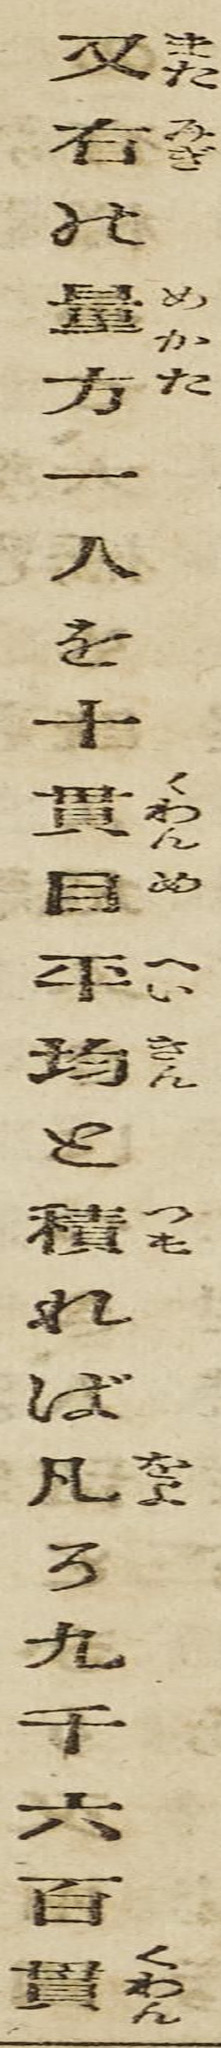又右の量方一人を十貫目平均と積れば凡そ九千六百貫
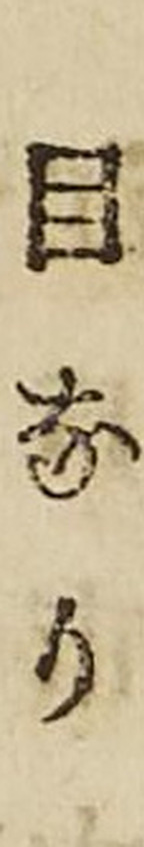目なり
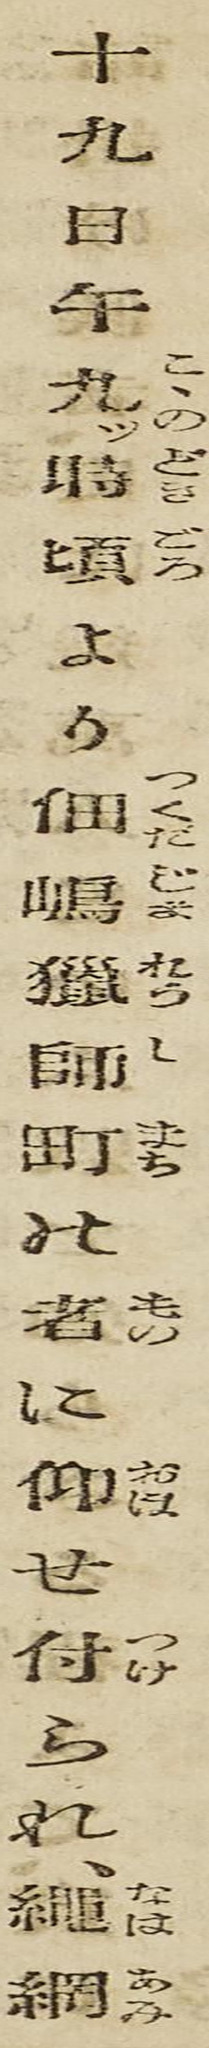十九日午九ツ時頃より佃嶋猟師町の者に仰せ付られ、縄網
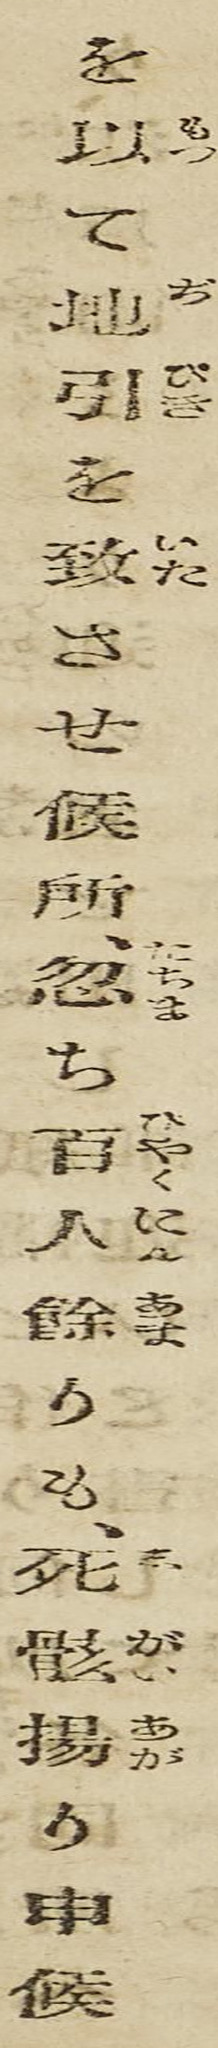を以て地引を致させ候所、忽ち百人余りも、死骸揚り申候
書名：永代惨話　文化の夢　全
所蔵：東京大学地震研究所図書室 Earthquake Research Institute Library, The University of Tokyo, JAPAN
